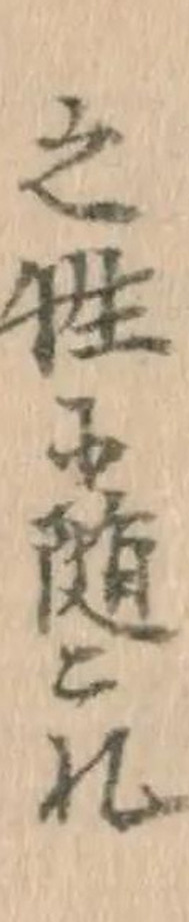之性に随これ
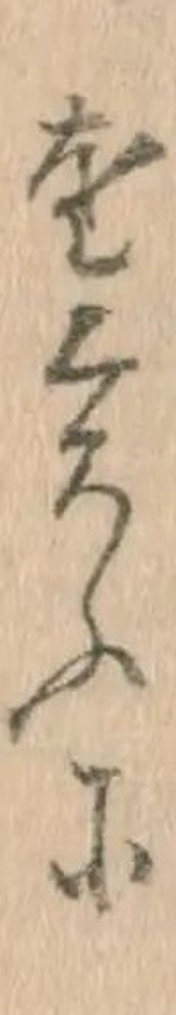をくろふに
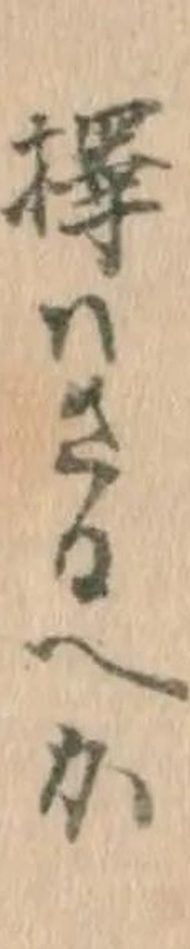択はさるへか
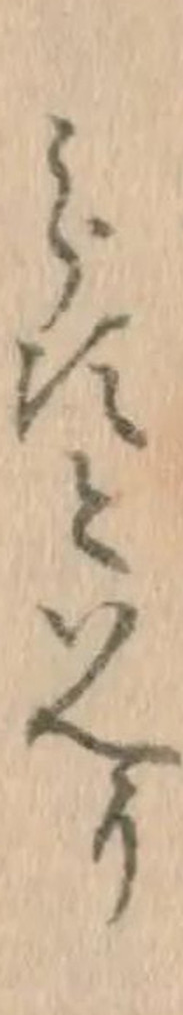らすといへり
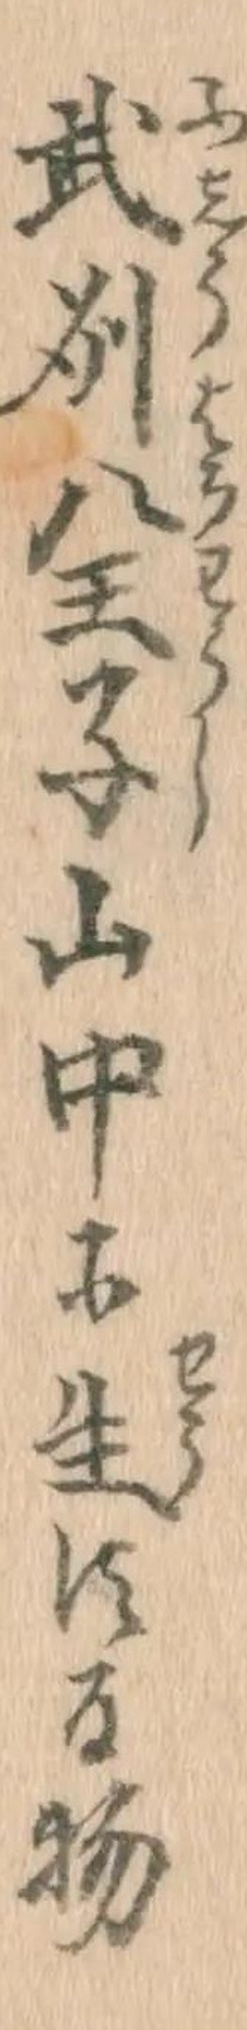武州八王子山中に生する物

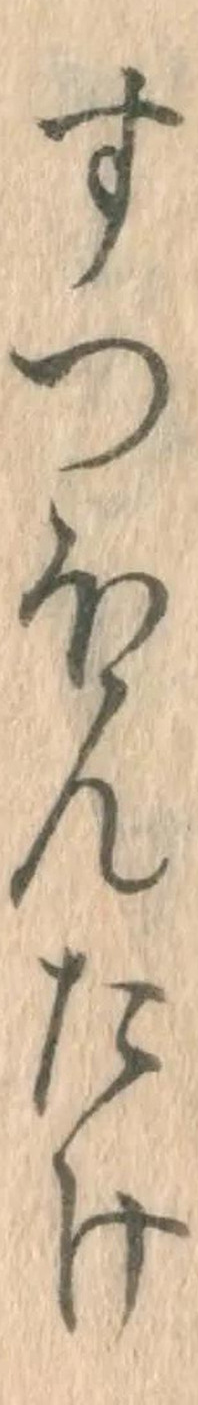すつほんたけ
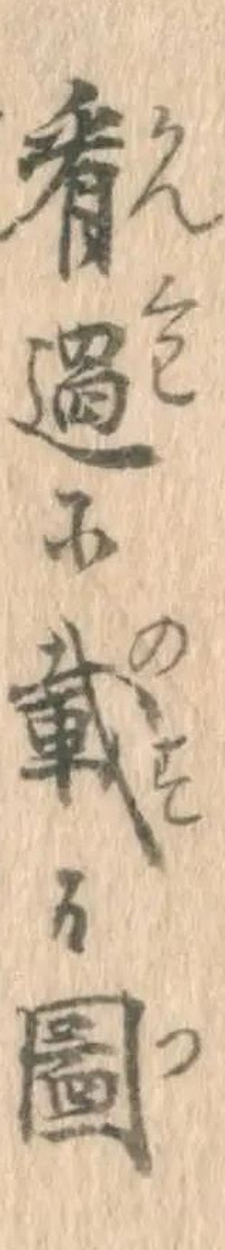看過に載る図
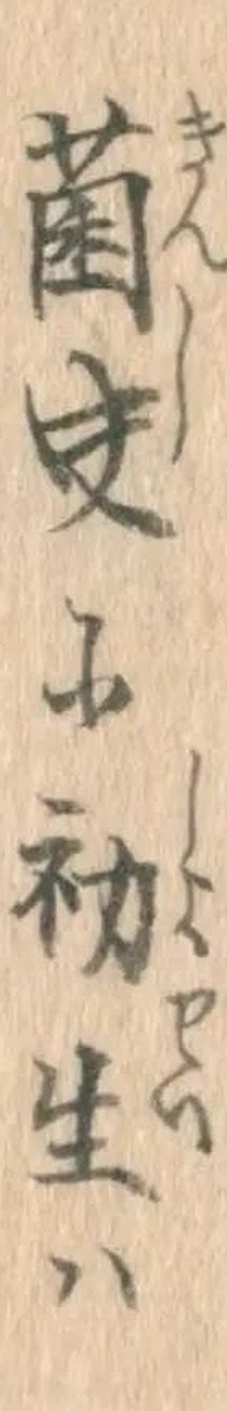菌史に初生は
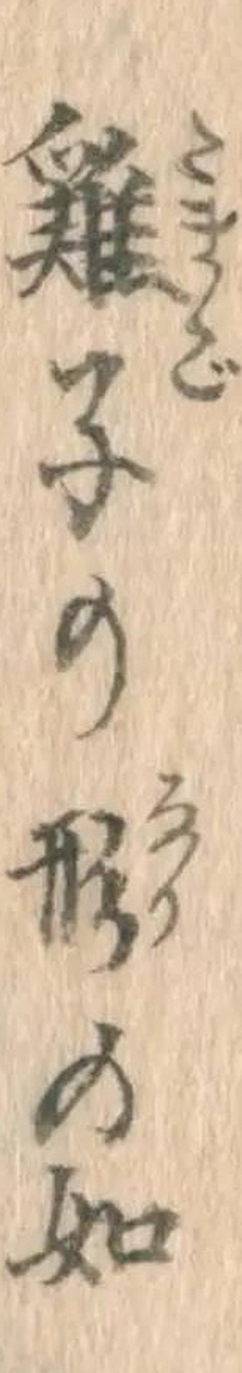鶏子の形の如
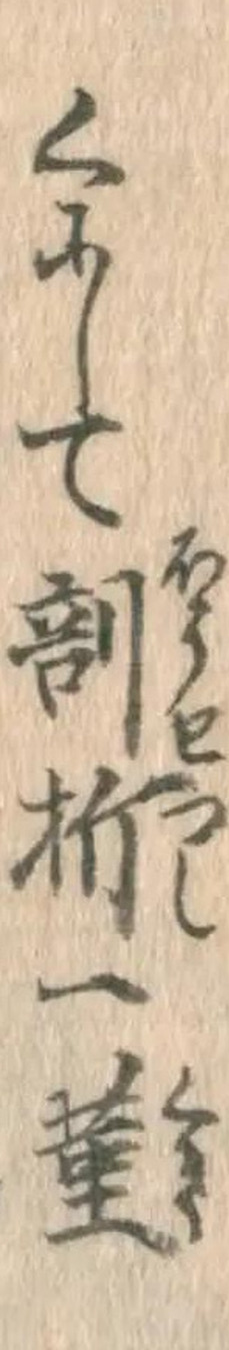くにして剖折一茎
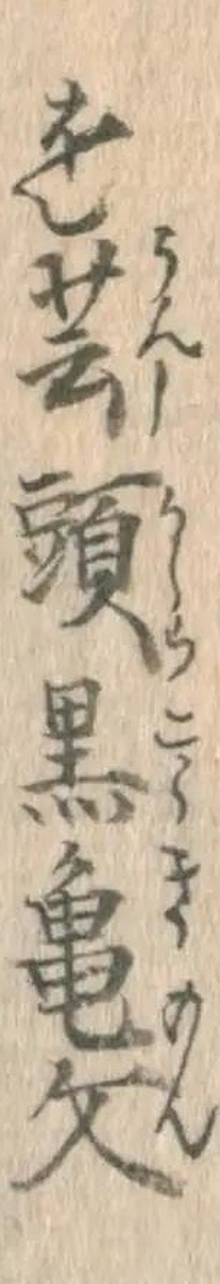を芸頭黒亀文
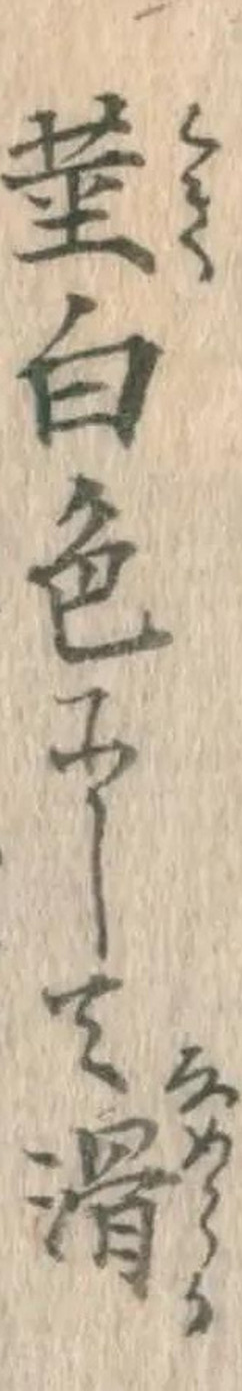茎白色にして滑
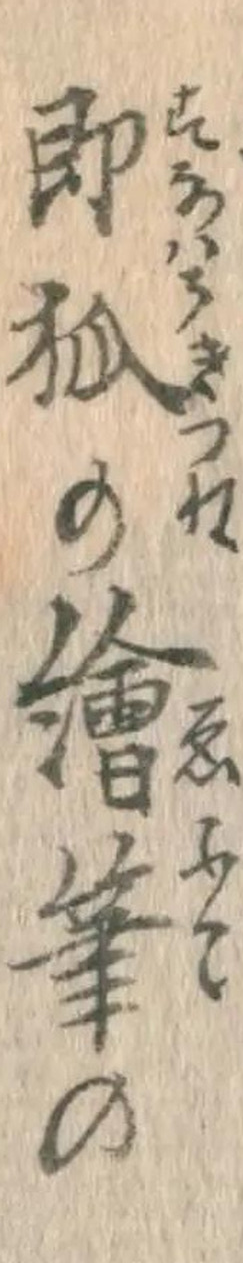即狐の絵筆の
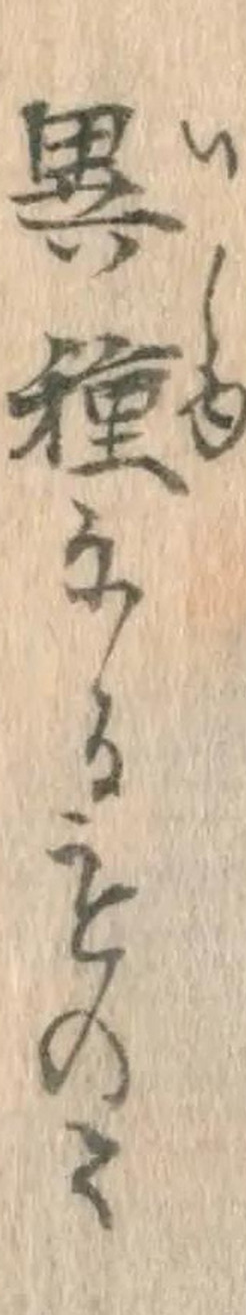異種なるものと
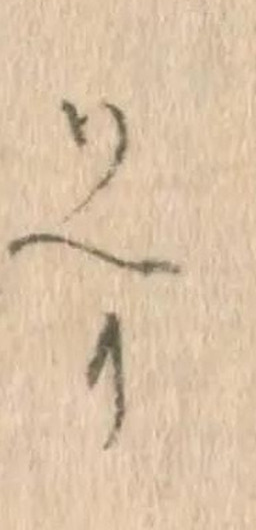いへり
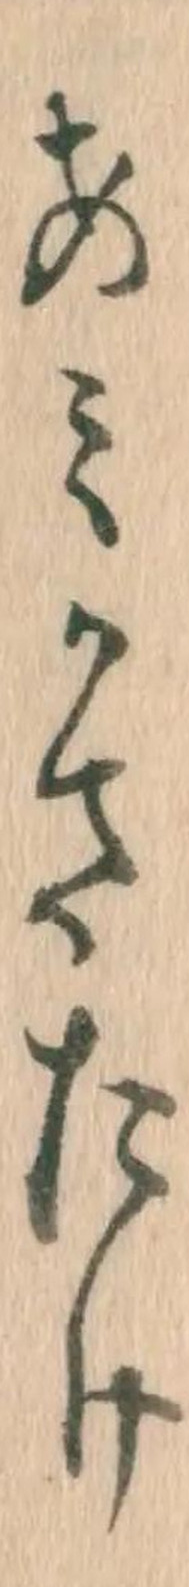あみかさたけ
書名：本草図譜. 巻58-60
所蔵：国立国会図書館 National Diet Library, JAPAN
